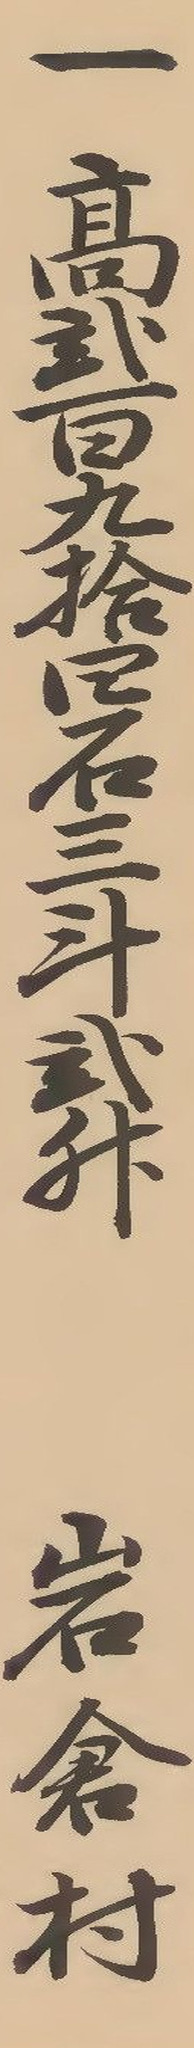一高弐百九拾四石三斗弐升岩倉村
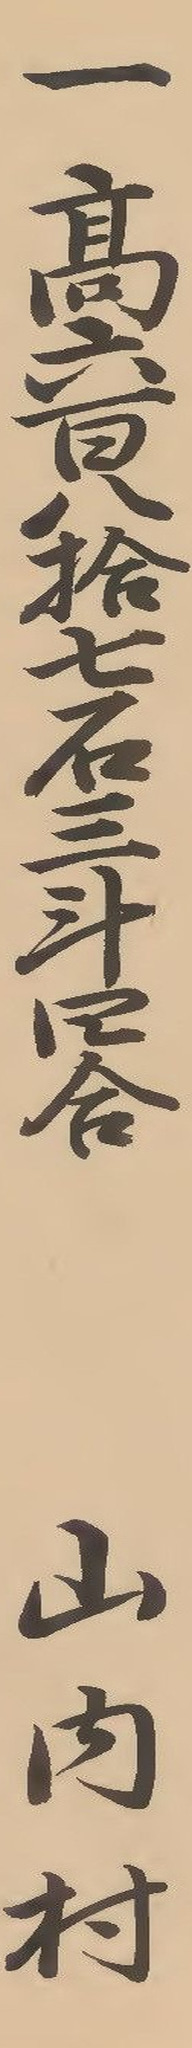一高六百八拾七石三斗四合山内村
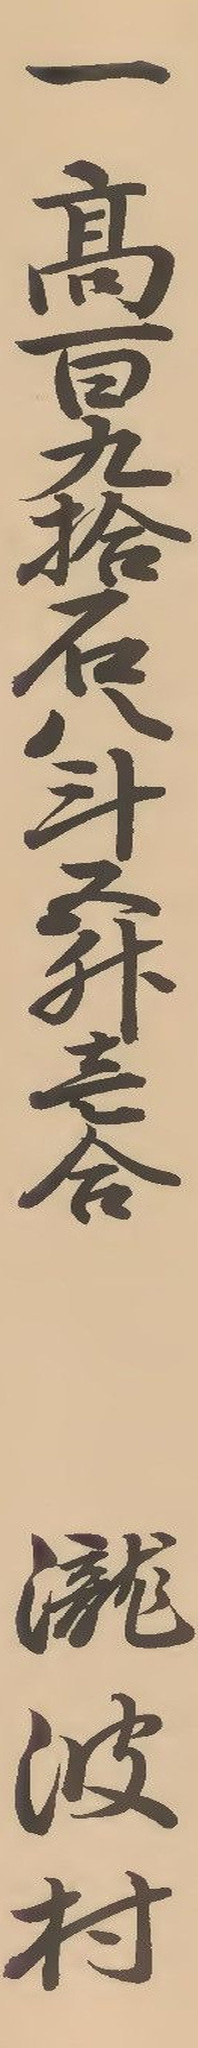一高百九拾石八斗五升壱合滝波村
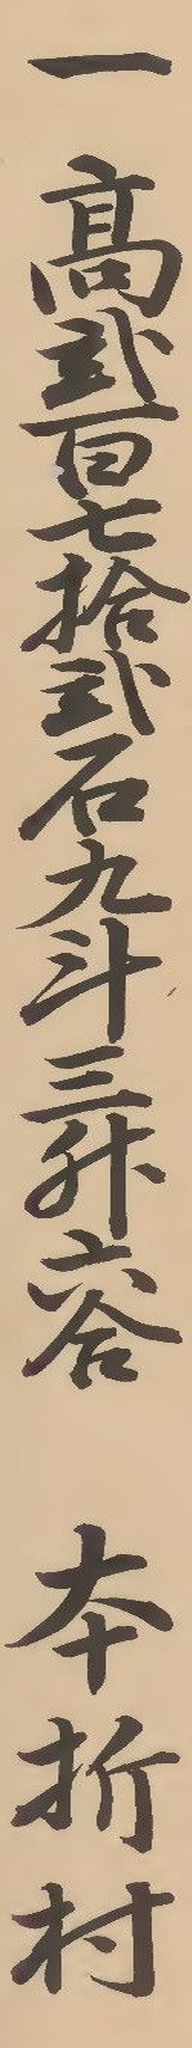一高弐百七拾弐石九斗三升六合本折村
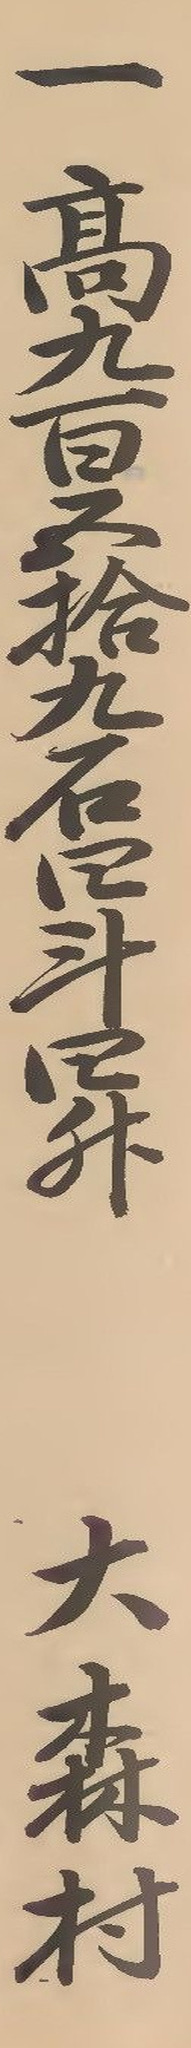一高九百五拾九石四斗四升大森村
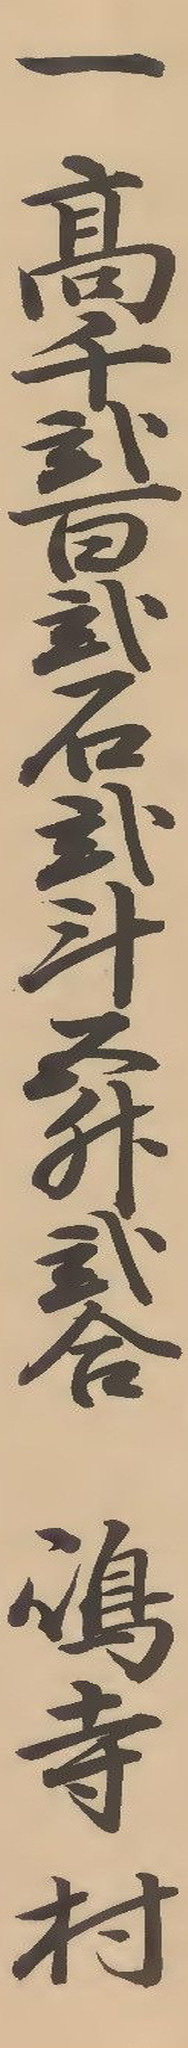一高千弐百弐石弐斗五升弐合島寺村
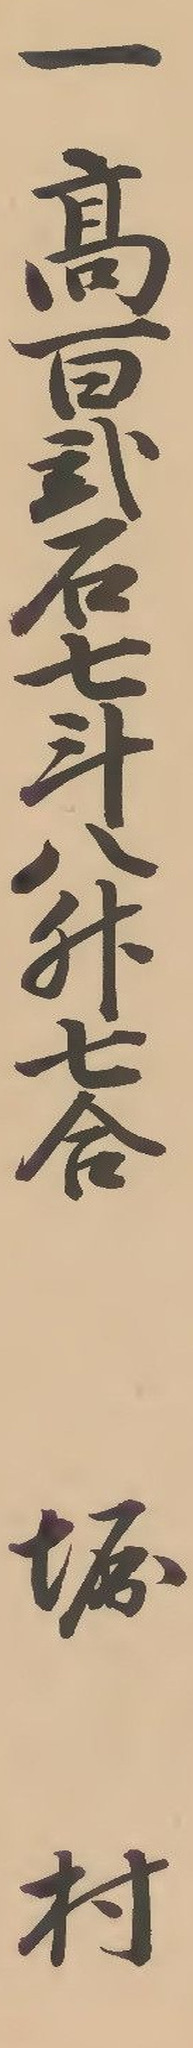一高百弐石七斗八升七合堀村

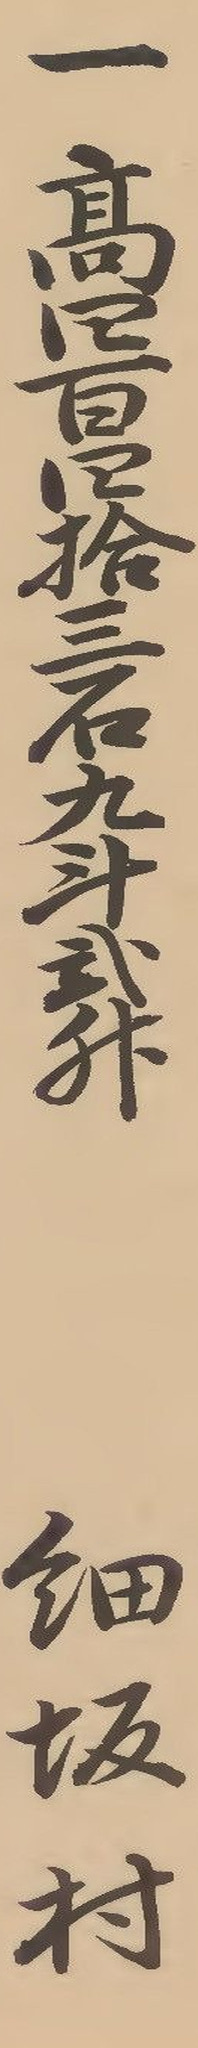一高四百四拾三石九斗弐升細坂村
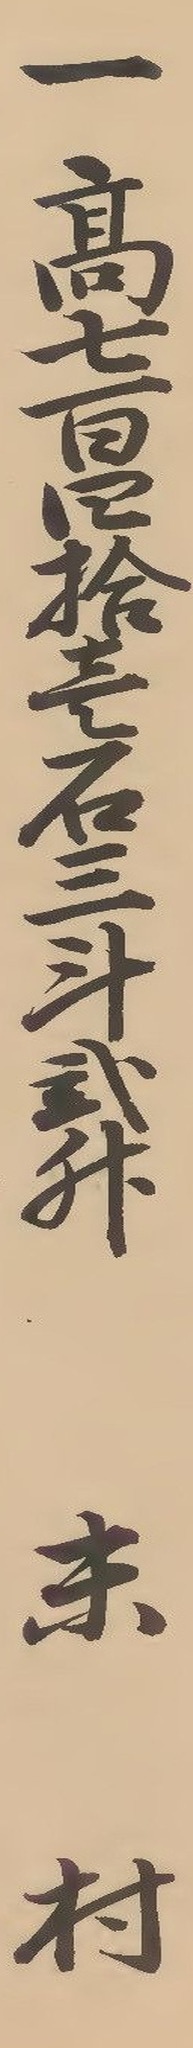一高七百四拾壱石三斗弐升末村
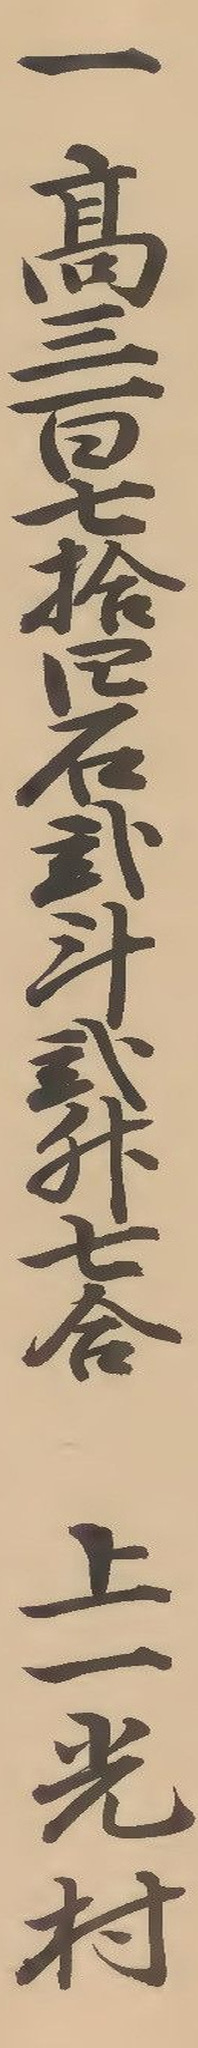一高三百七拾四石弐斗弐升七合上一光村
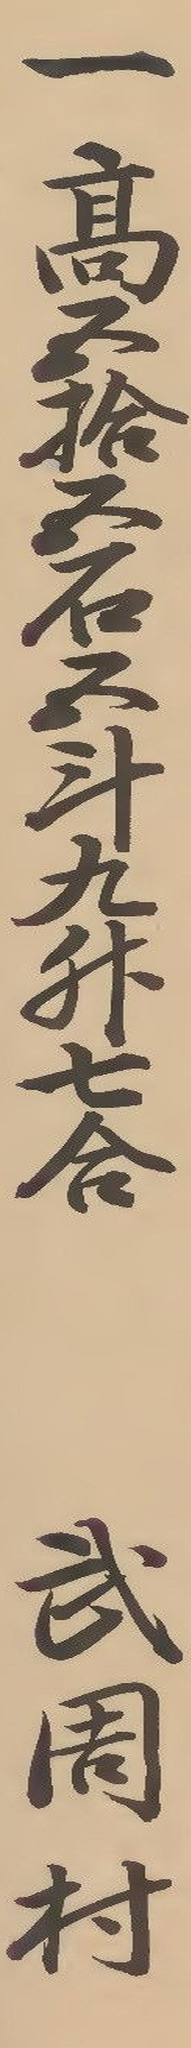一高五拾五石五斗九升七合武周村
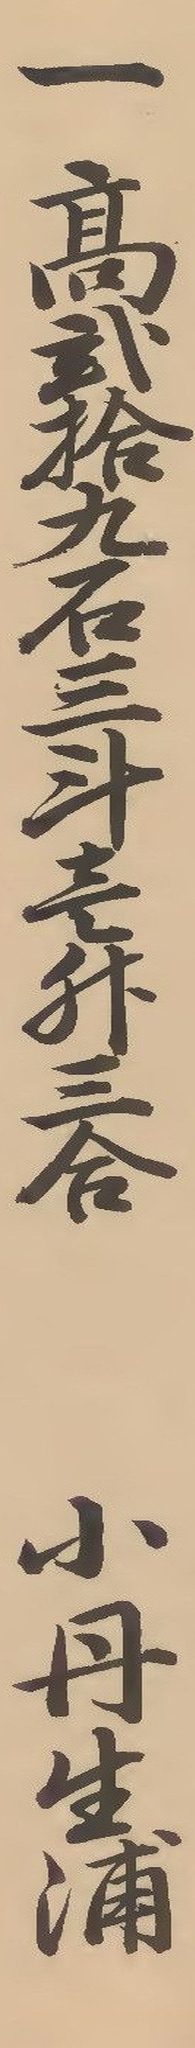一高弐拾九石三斗壱升三合小丹生浦
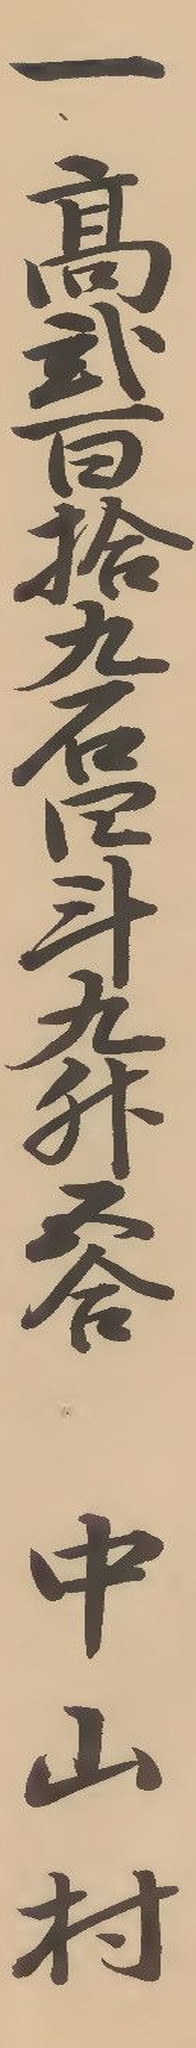一高弐百拾九石四斗九升五合中山村
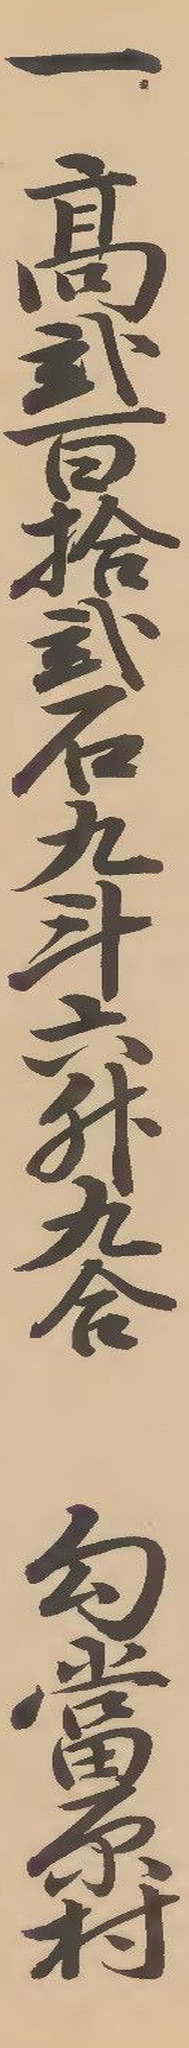一高弐百拾弐石九斗六升九合勾当原村

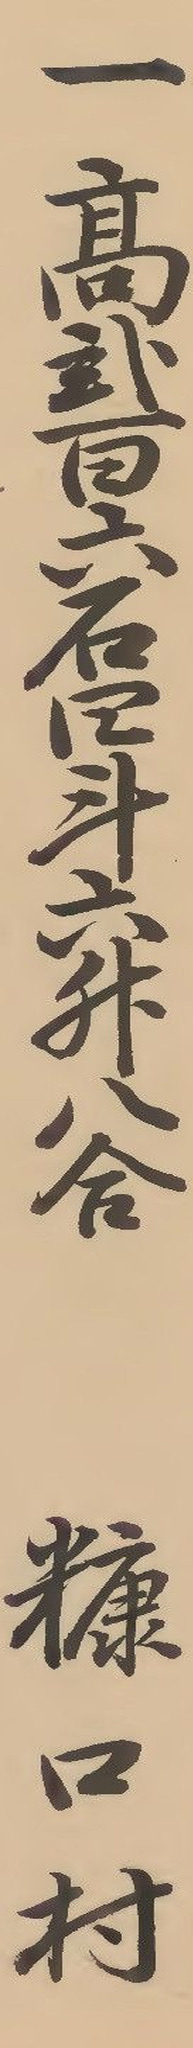一高弐百六石四斗六升八合糠口村
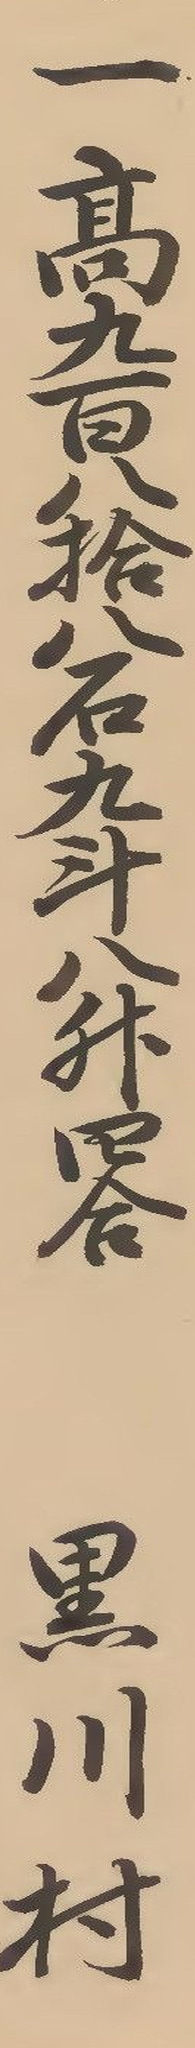一高九百八拾八石九斗八升四合黒川村
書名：越前国郷帳
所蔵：国立公文書館 National Archives of Japan
